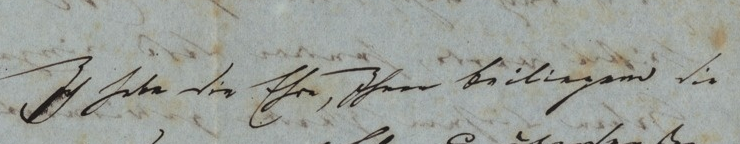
Ich habe die Ehre, Ihnen beiliegend die
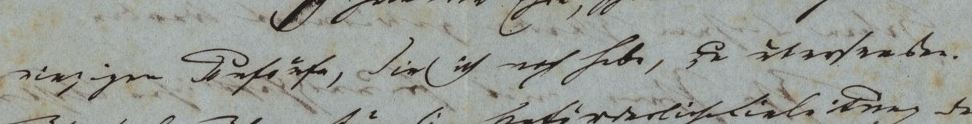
einzigen Aufrüfe, die ich noch habe, zu übersenden.
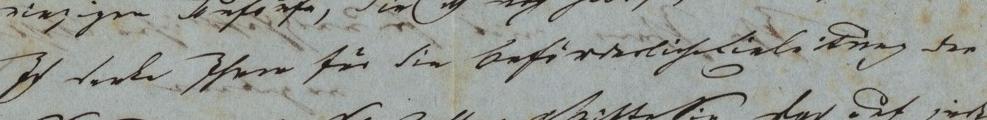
Ich danke Ihnen für die beförderliche Einleitung der
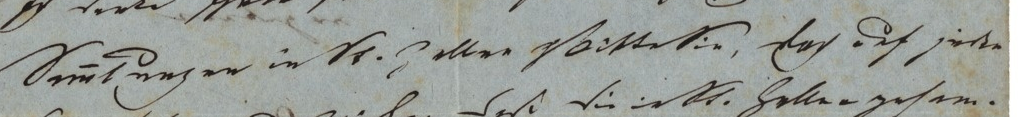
Sammlungen in St. Gallen & bitte Sie, doch auf jeden
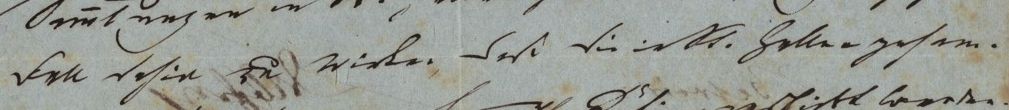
Fall dahin wirken, daß die in St. Gallen gesam-
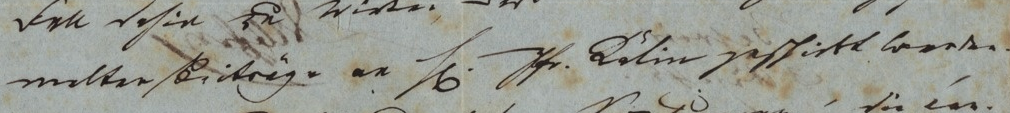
melten Beiträge an H. Pfr. Kälin geschickt werden.
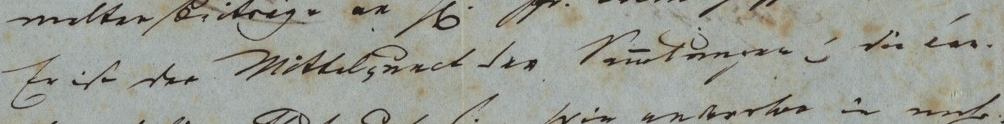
Er ist der Mittelpunct der Sammlungen; – die Cen-
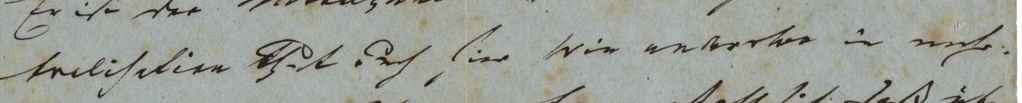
tralisation thut auch hier wie anderwo in mehr-
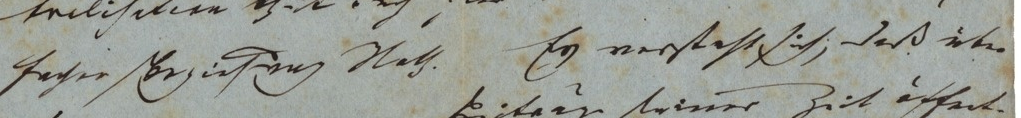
facher Beziehung Noth. Es versteht sich, daß über
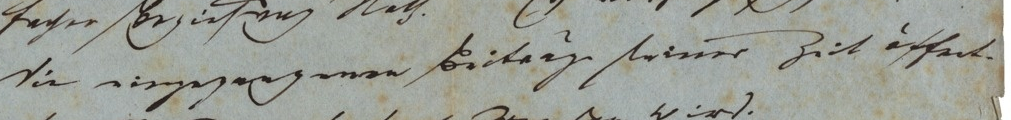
die eingegangenen Beiträge seiner Zeit öffent-
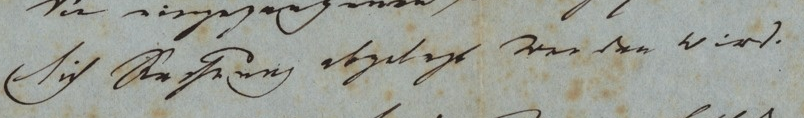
lich Rechnung abgelegt werden wird.
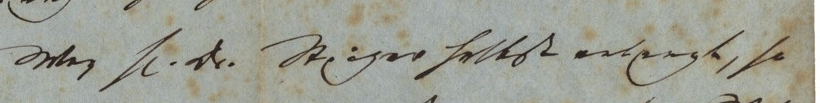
Was H. Dr. Steiger selbst anlangt, so
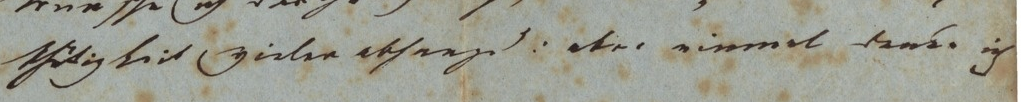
thätigkeit vieler abhange», aber einmal denke ich
